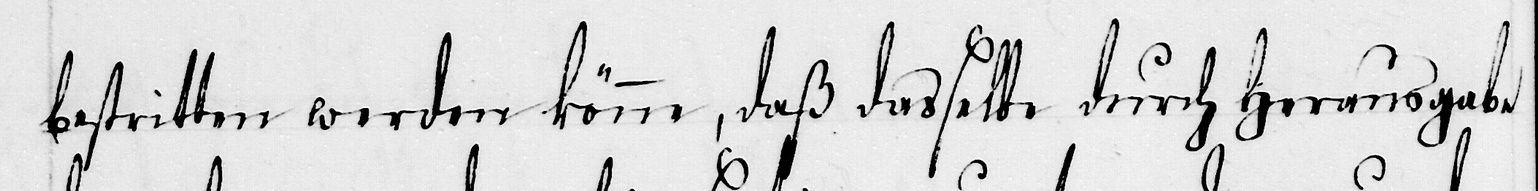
bestritten werden könne, daß dasselbe durch Herausgabe
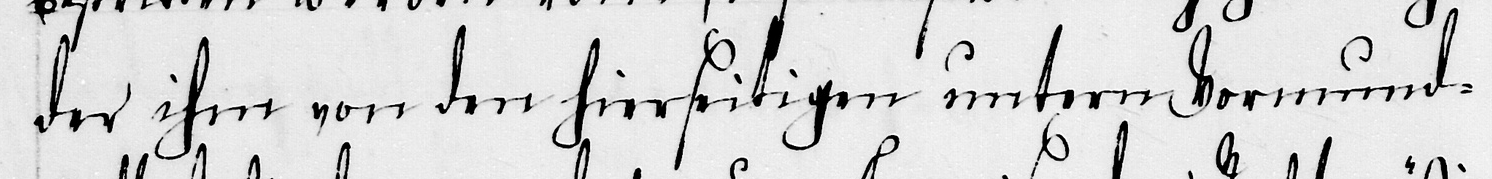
der ihm von der hierseitigen untern Vormund¬
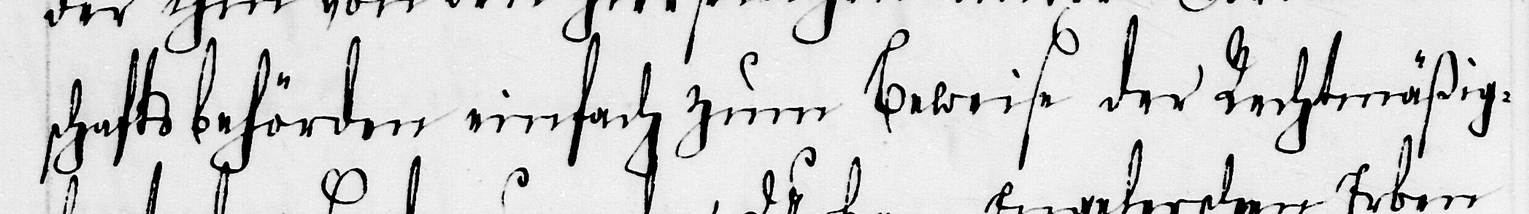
schaftsbehörden einfach zum Beweise der Rechtmäßig¬
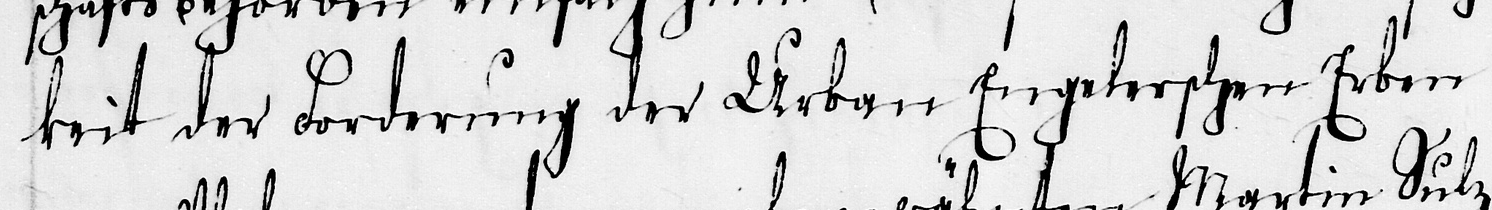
keit der Forderung der Urban Engelerschen Erben
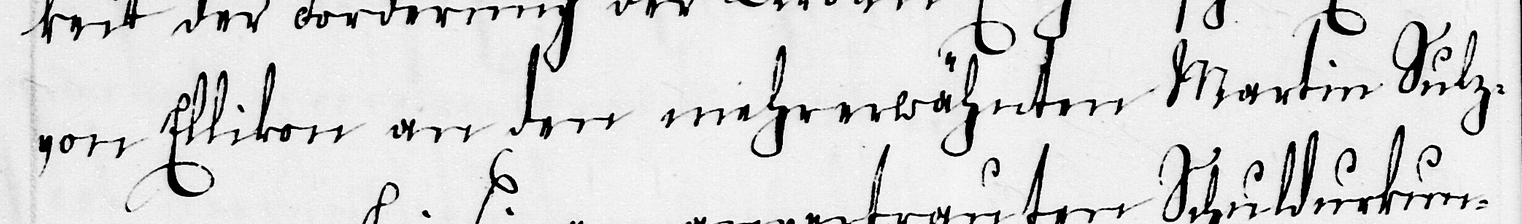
von Ellikon an den mehrerwähnten Martin Sulz¬
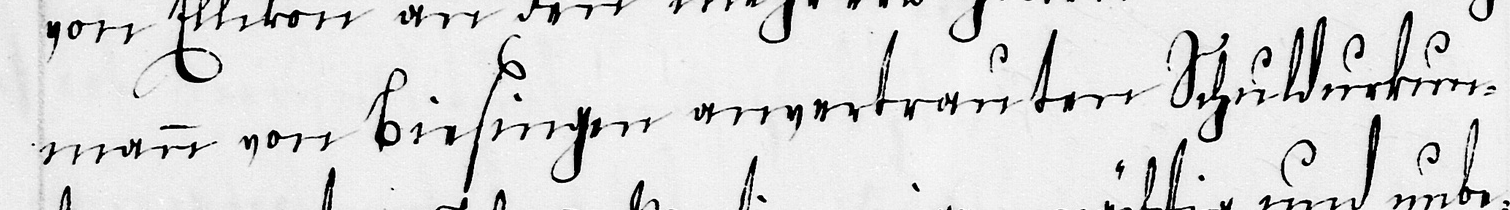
mann von Biesingen anvertrauten Schuldurkun¬
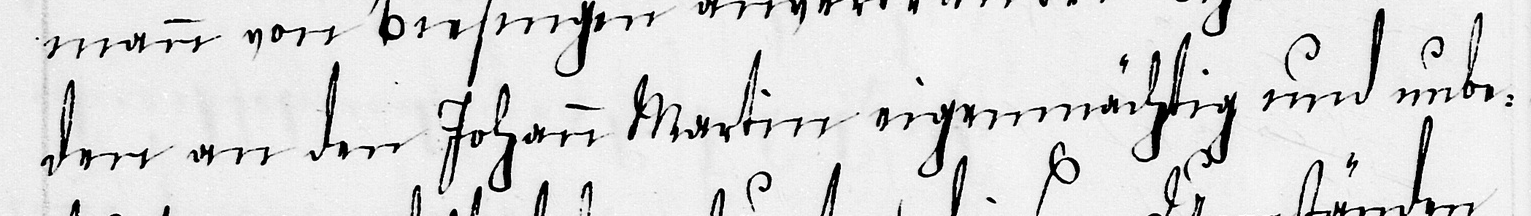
den an den Johann Martin eigenmächtig und unbe¬
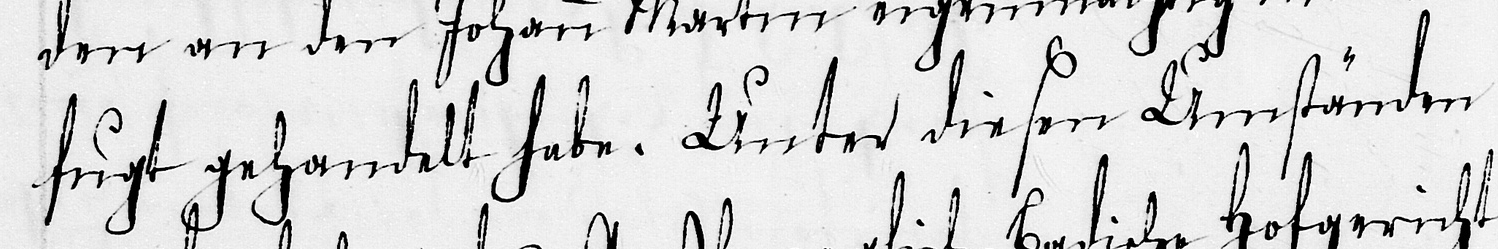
fugt gehandelt habe. Unter diesen Umständen
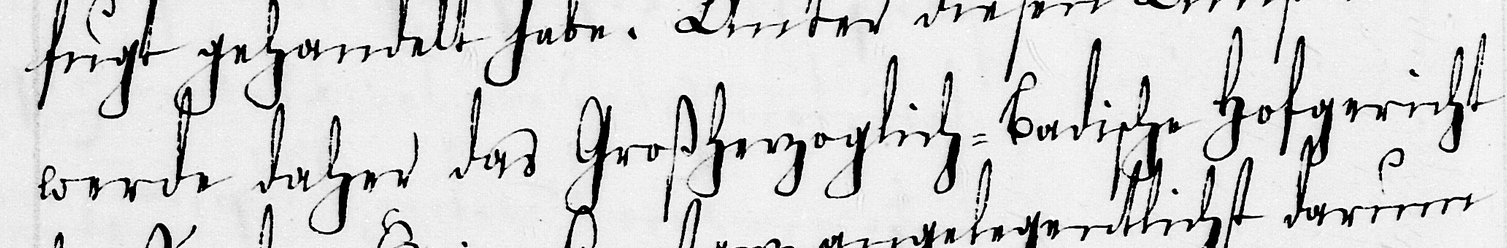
werde daher das Großherzoglich-Badische Hofgericht
